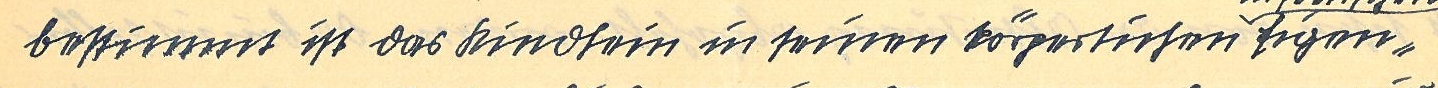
bestimmt ist das Kindlein in seinen körperlichen Eigen¬
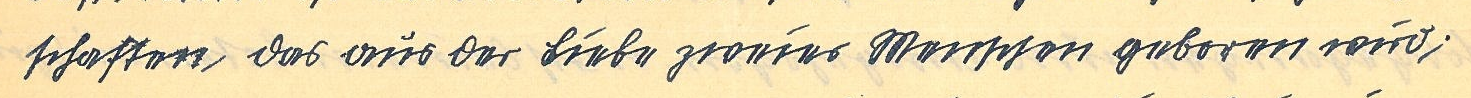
schaften, das aus der Liebe zweier Menschen geboren wird;
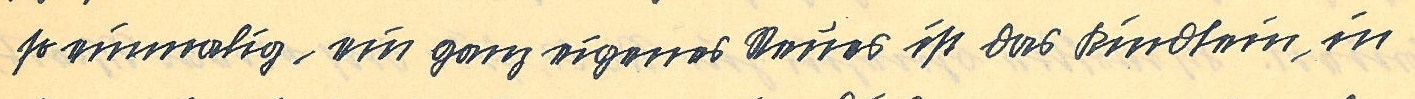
so einmalig, ein ganz eigenes Neues ist das Kindlein, in
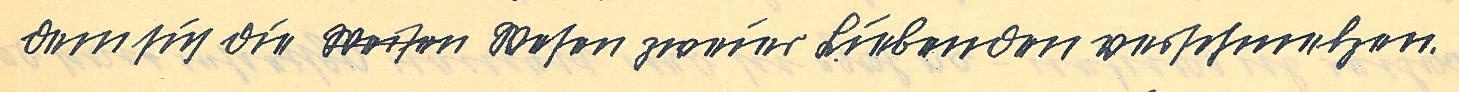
dem sich die Weisen Wesen zweier Liebenden verschmelzen.
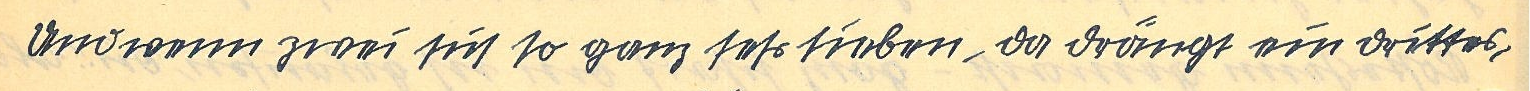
Und wenn zwei sich so ganz sehr lieben, da drängt ein Drittes,
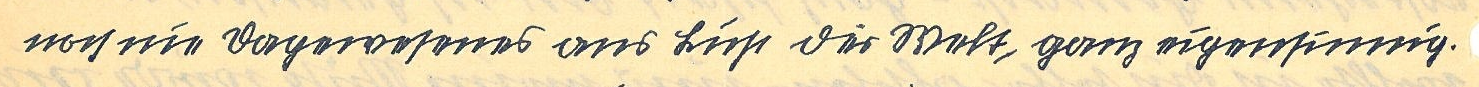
noch nie Dagewesenes ans Licht der Welt, ganz eigensinnig.
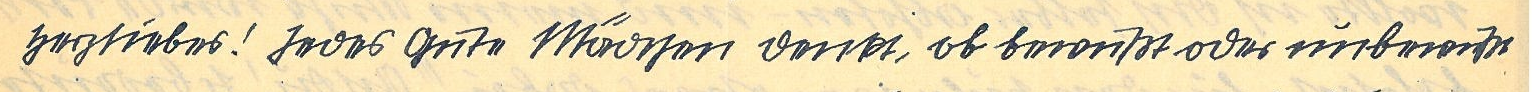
Herzliebes! Jedes gute Mädchen denkt, ob bewußt oder unbewußt
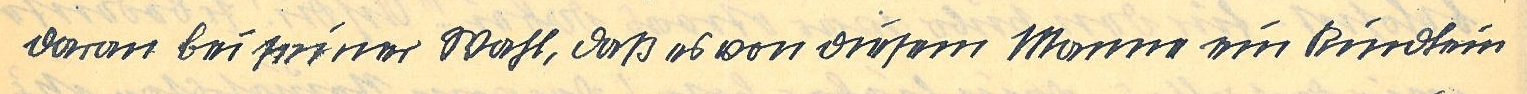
daran bei seiner Wahl, daß es von diesem Manne ein Kindlein
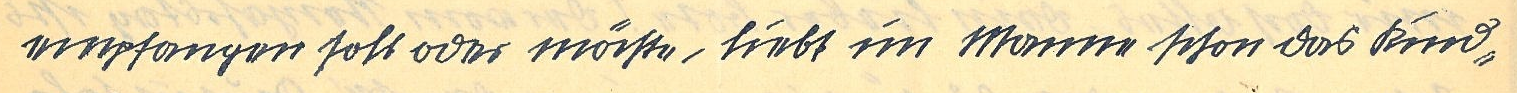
empfangen soll oder möchte, liebt im Manne schon das Kind¬
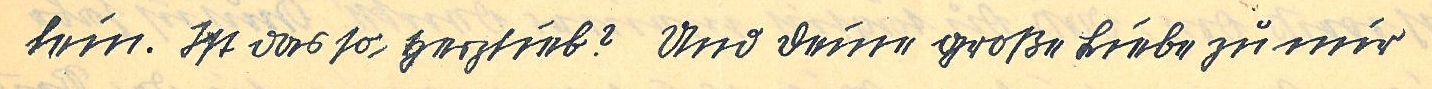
lein. Ist das so, Herzlieb? Und Deine große Liebe zu mir
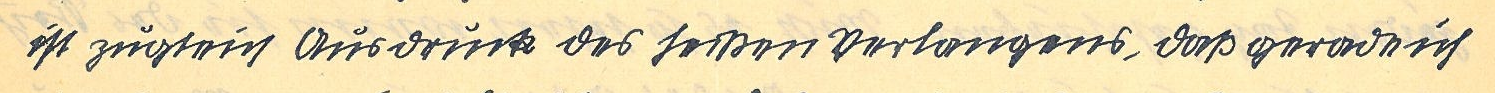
ist zugleich Ausdruck des heißen Verlangens, daß gerade ich
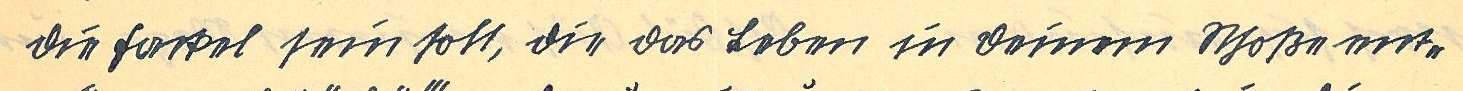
die Fackel sein soll, die das Leben in Deinem Schoße ent¬
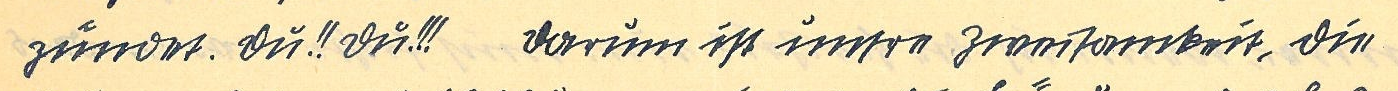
zündet. Du!! Du!!! Darum ist unsre Zweisamkeit, die
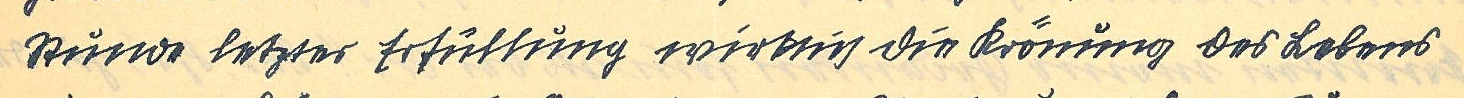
Stunde letzter Erfüllung wirklich die Krönung des Lebens
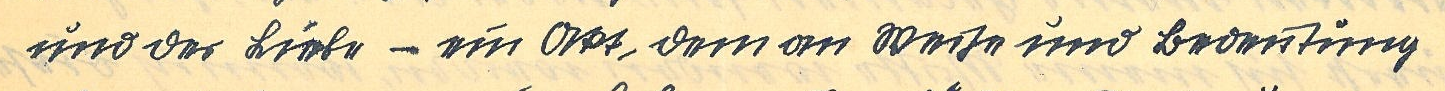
und der Liebe – ein Akt, dem an Weihe und Bedeutung
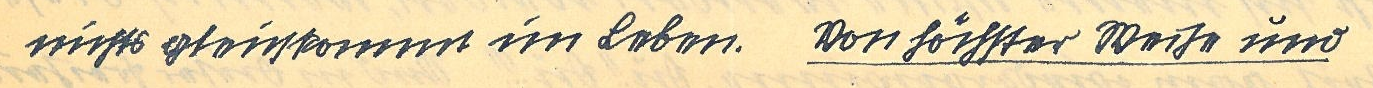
nichts gleichkommt im Leben. Von höchster Weihe und
